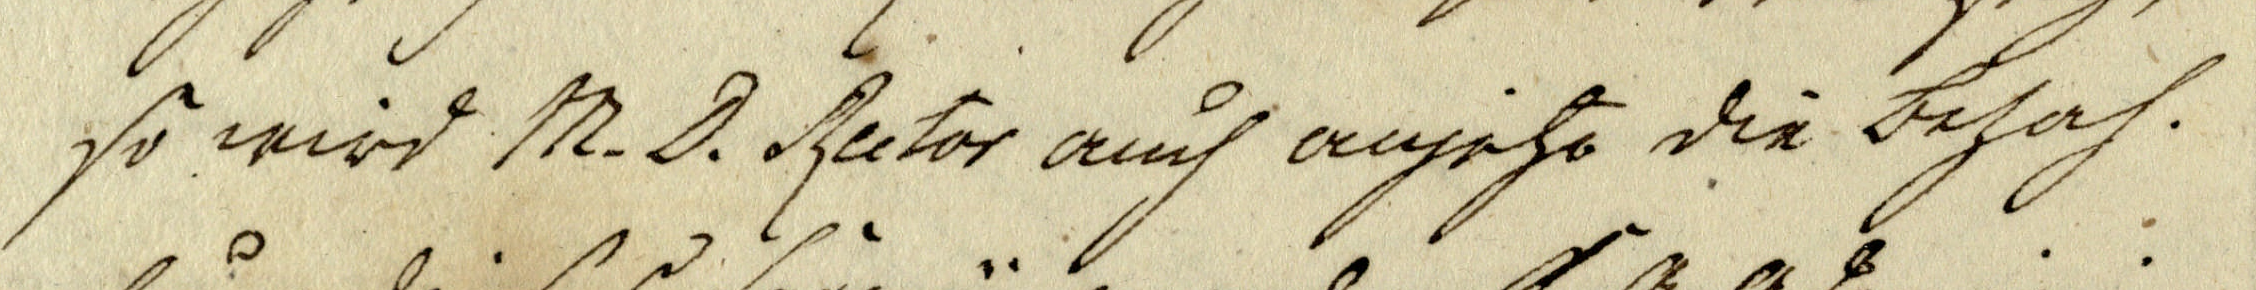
so wird M. D. Rector auch anjetzo die Bezah¬
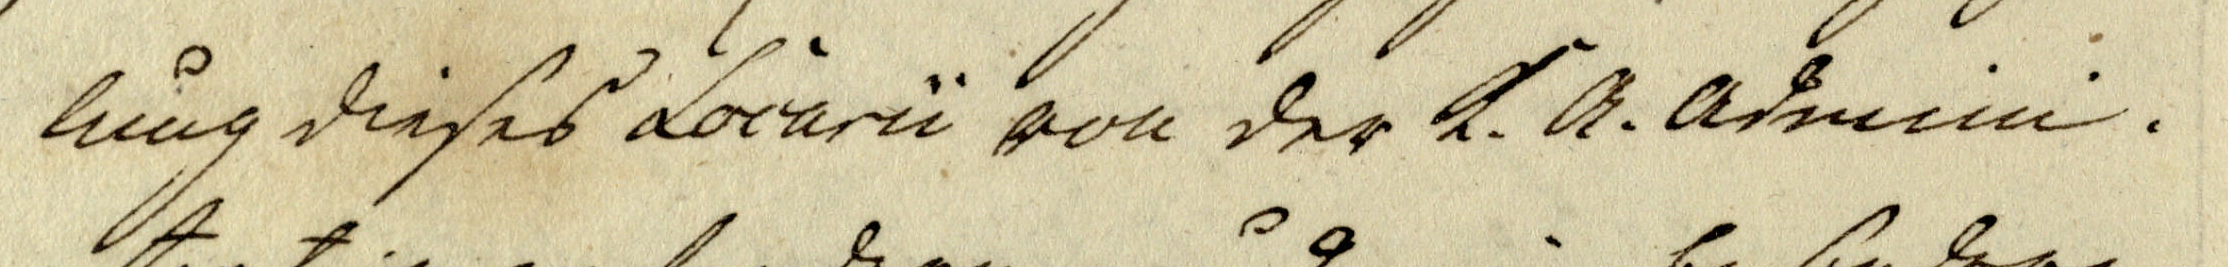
lung dieses Locarii von der K. A. Admini¬
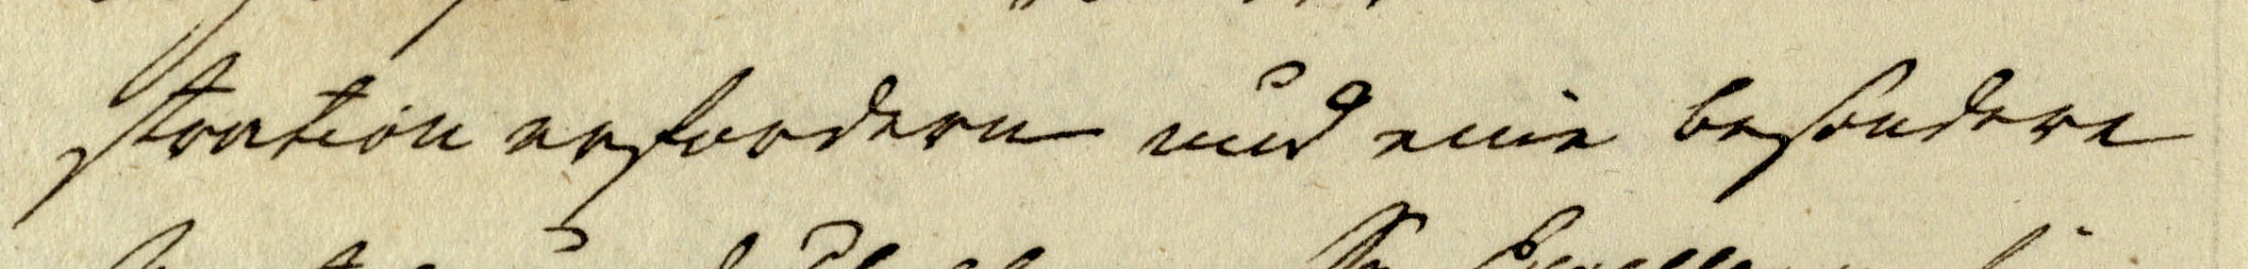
stration erfordern und eine besondere
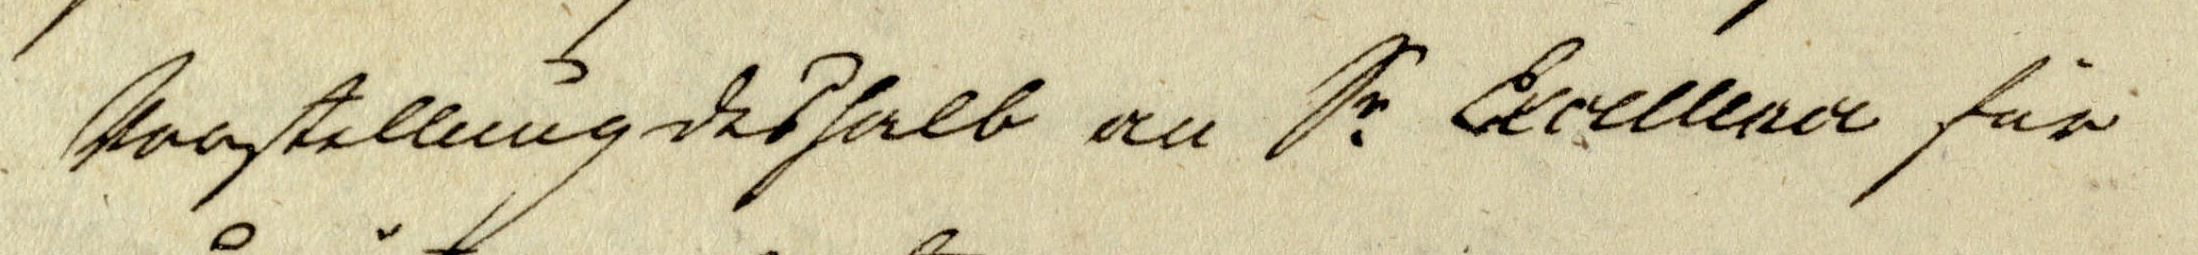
Vorstellung deshalb an Sr Excellence für
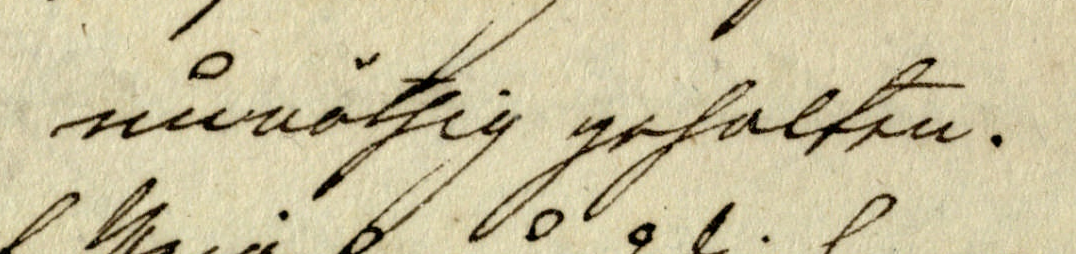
unnöthig gehalten.
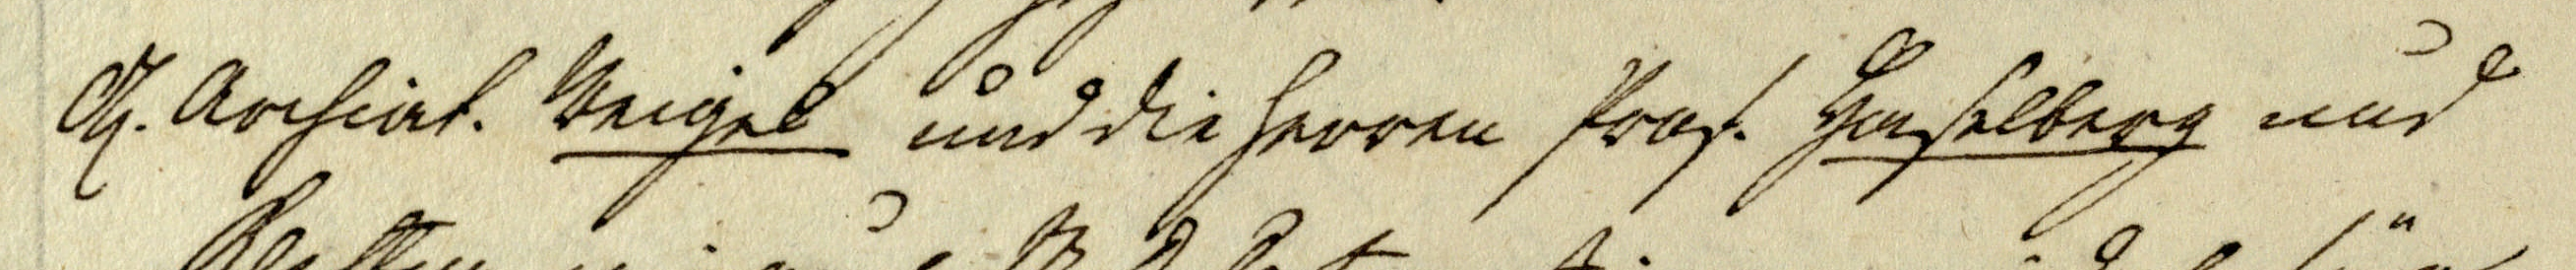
dh. Archiat. Weigel und die Herren Prof. Haselberg und
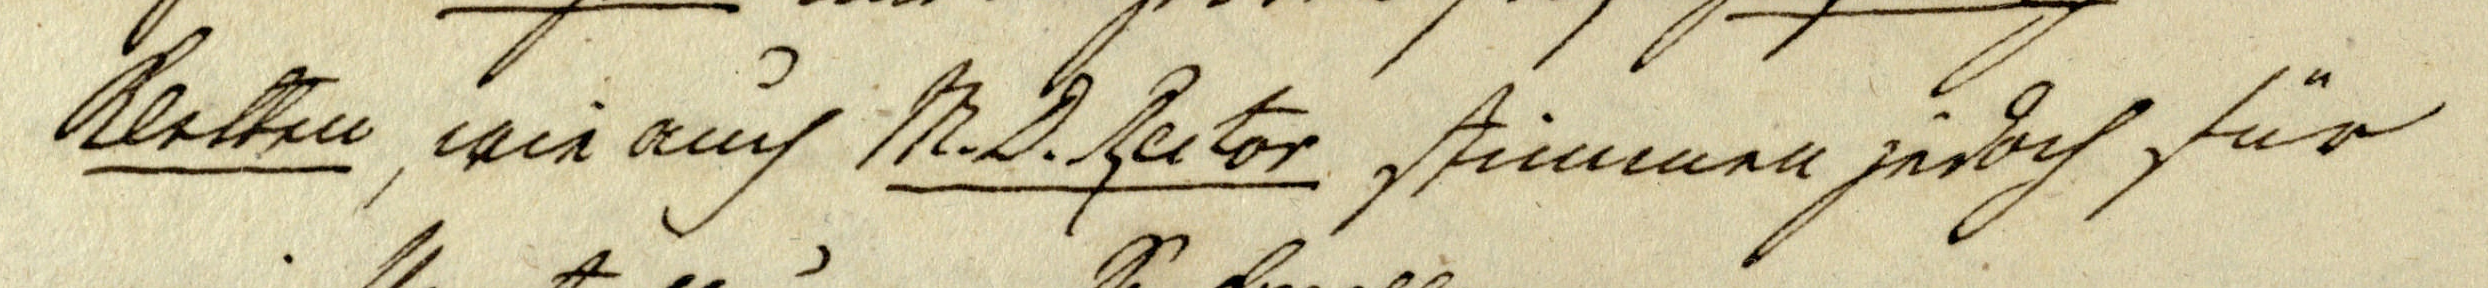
Kletten, wie auch M. D. Rector stimmen jedoch für
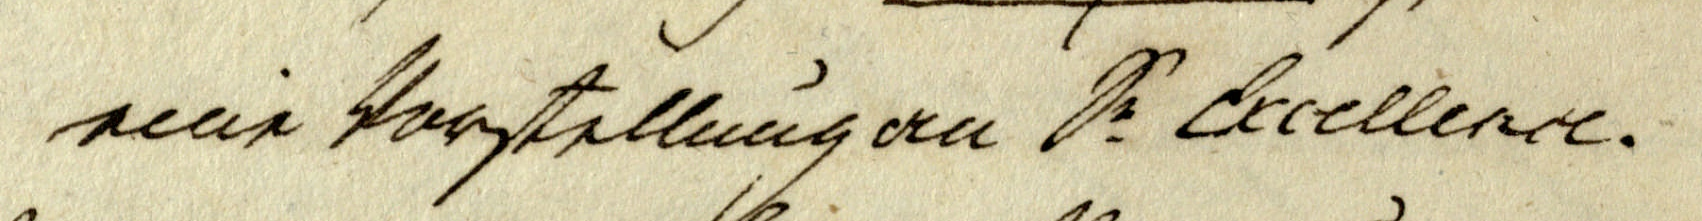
eine Vorstellung an Sr Excellence.
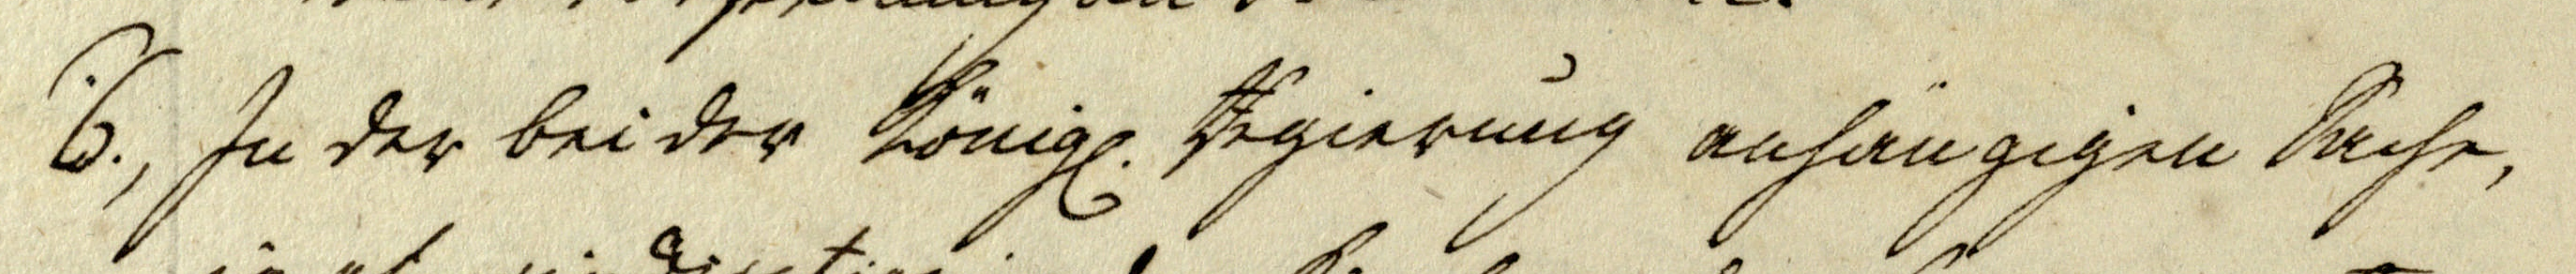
6., In der bei der Königl. Regierung anhängigen Sache,
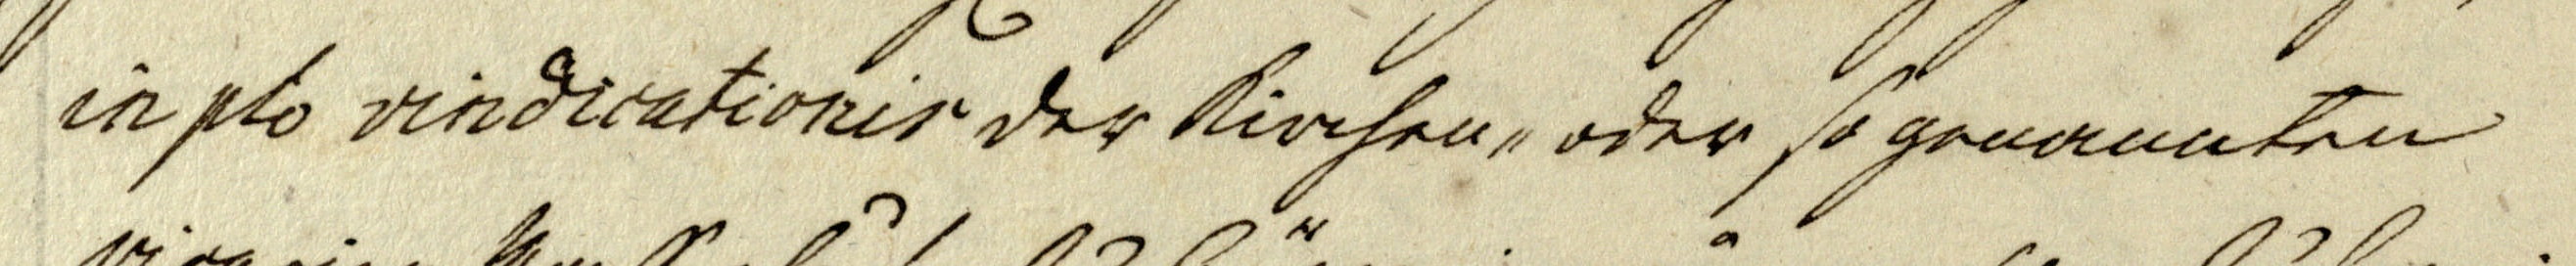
in pto vindicationis der Kirchen, oder so genannten
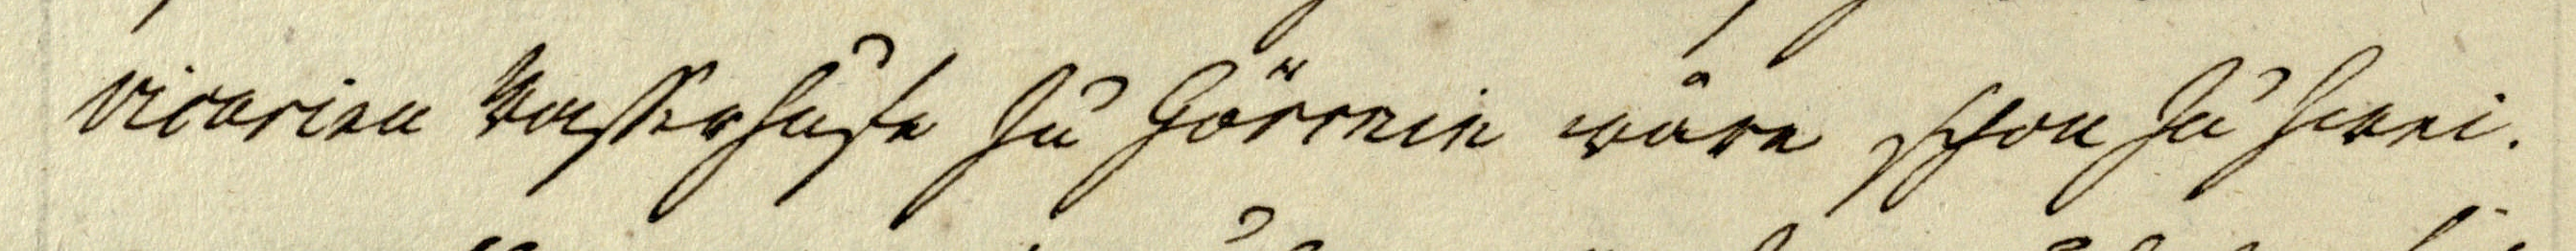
vicarien Wasserhufe zu Görmin wäre schon zu zwei¬
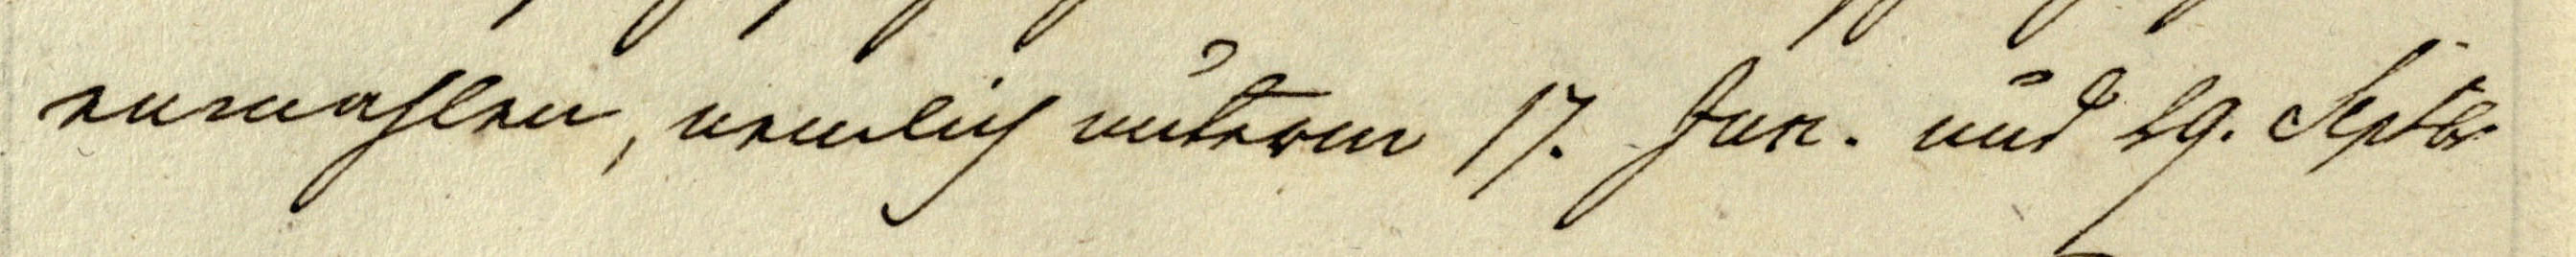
enmahlen, nemlich unterm 17. Jun. und 29. Septb.
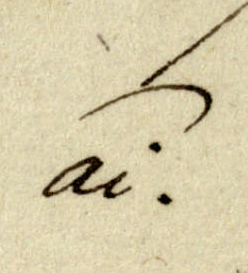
ai.
